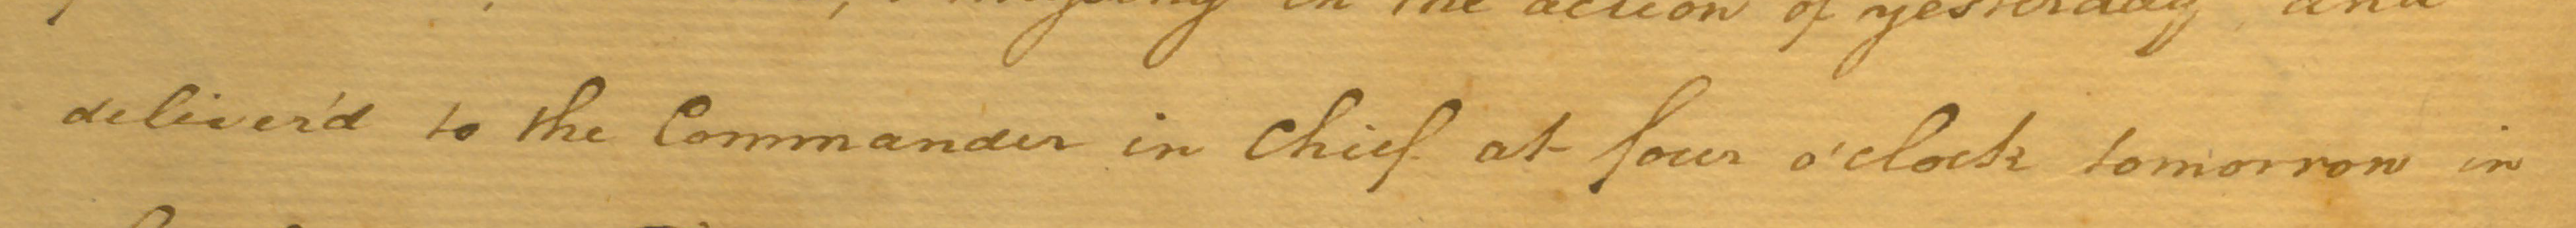deliver'd to the Commander in Chief at four o'clock tomorrow in
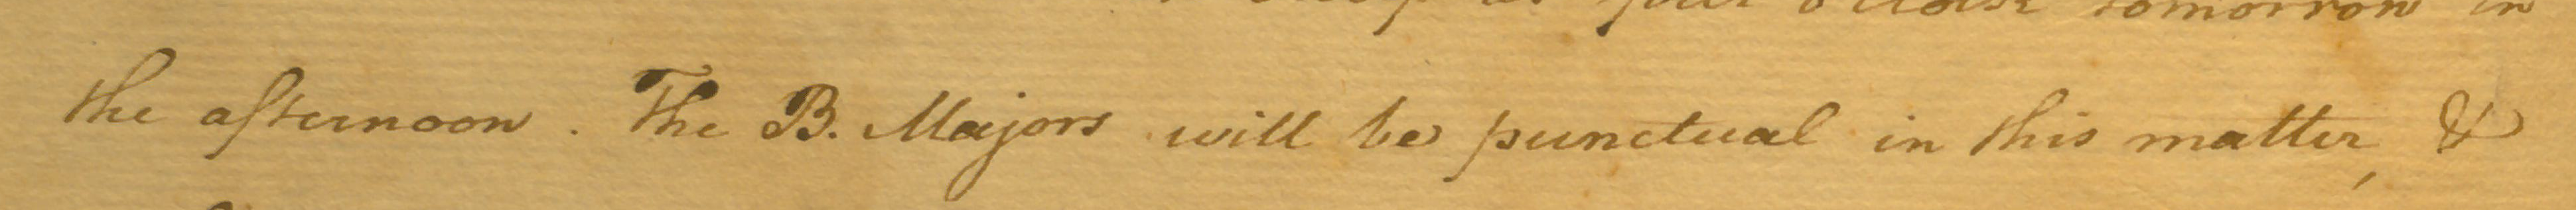the afternoon. The B. Majors will be punctual in this matter, &
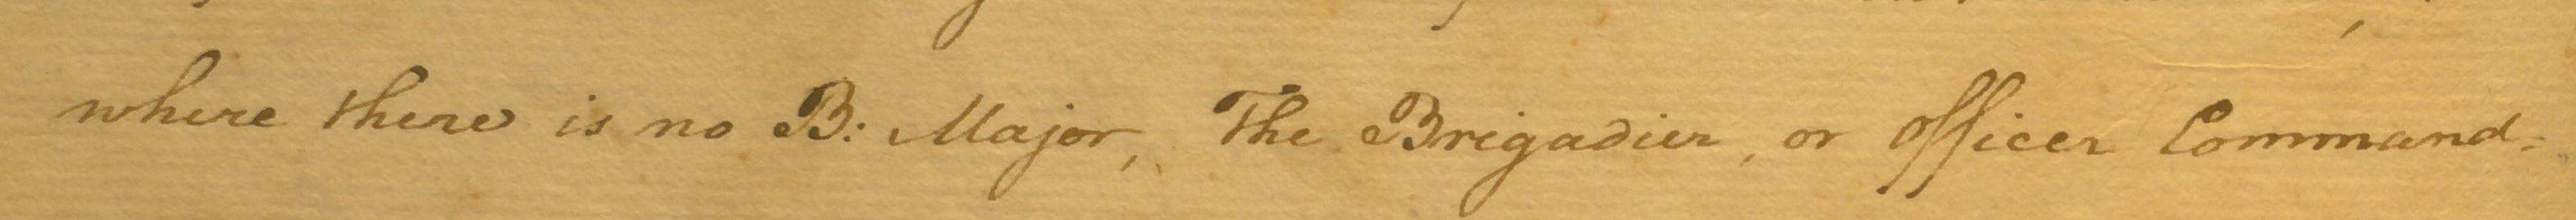where there is no B: Major, The Brigadier or officer Command-
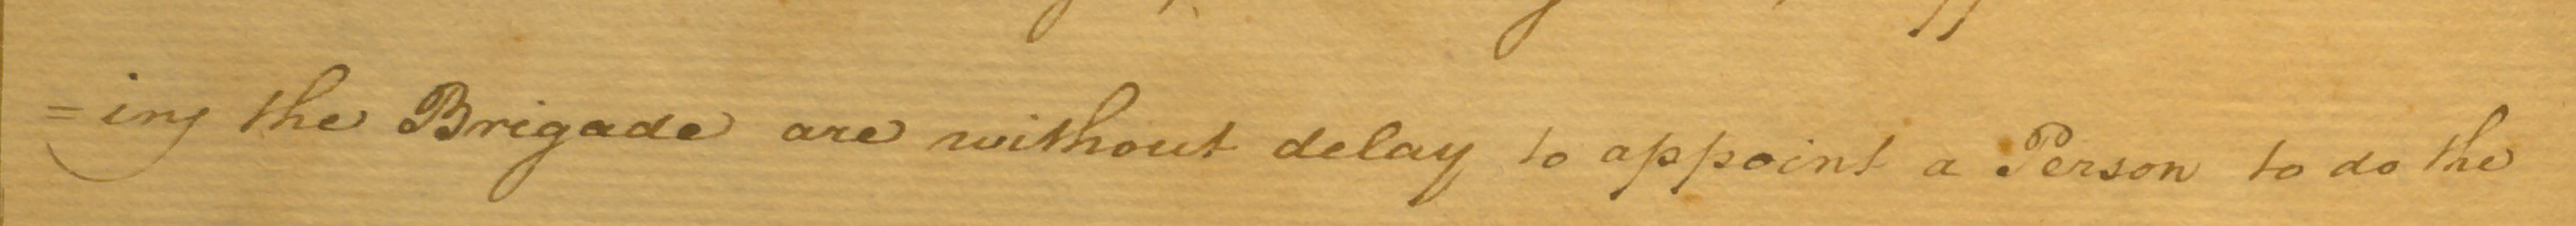-ing the Brigade are without delay to appoint a Person to do the
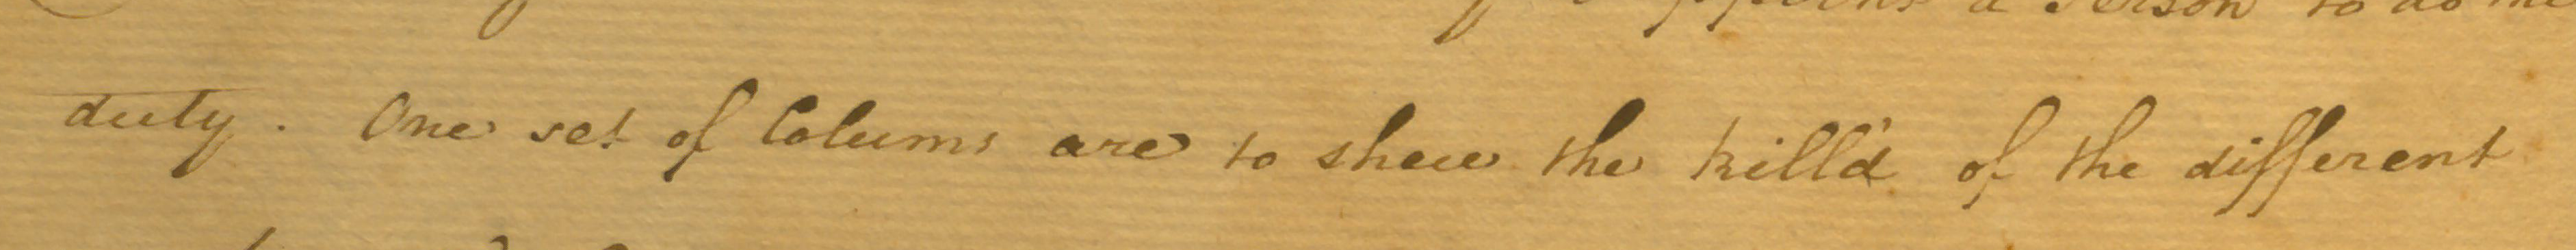duty. One set of Colums are to shew the kill'd of the different
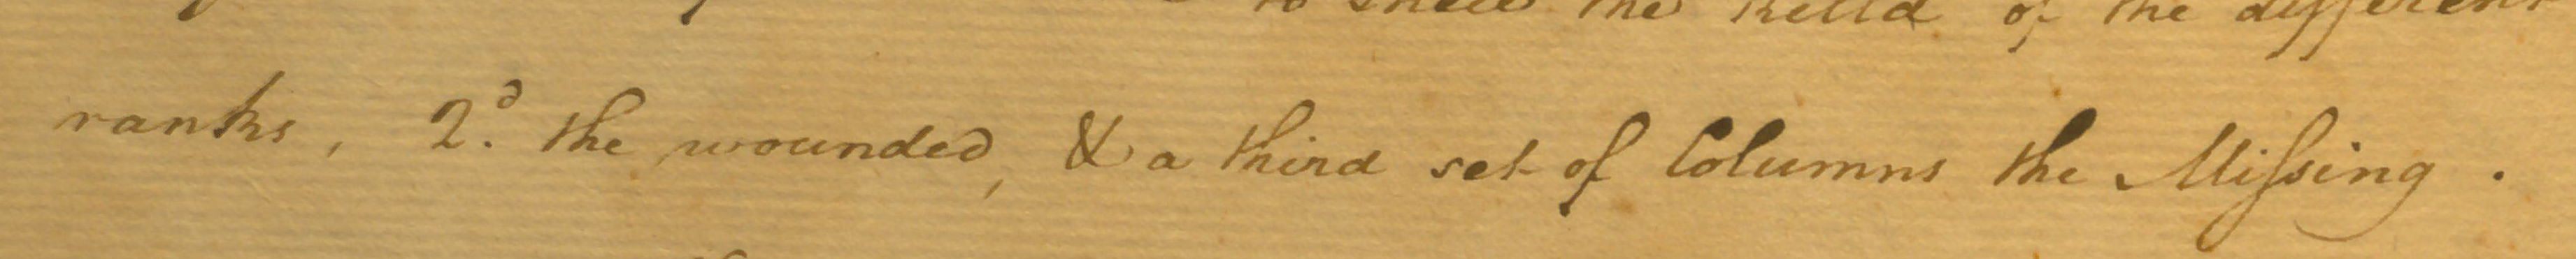ranks, 2^d. the wounded, & a third set of Columns the Missing.
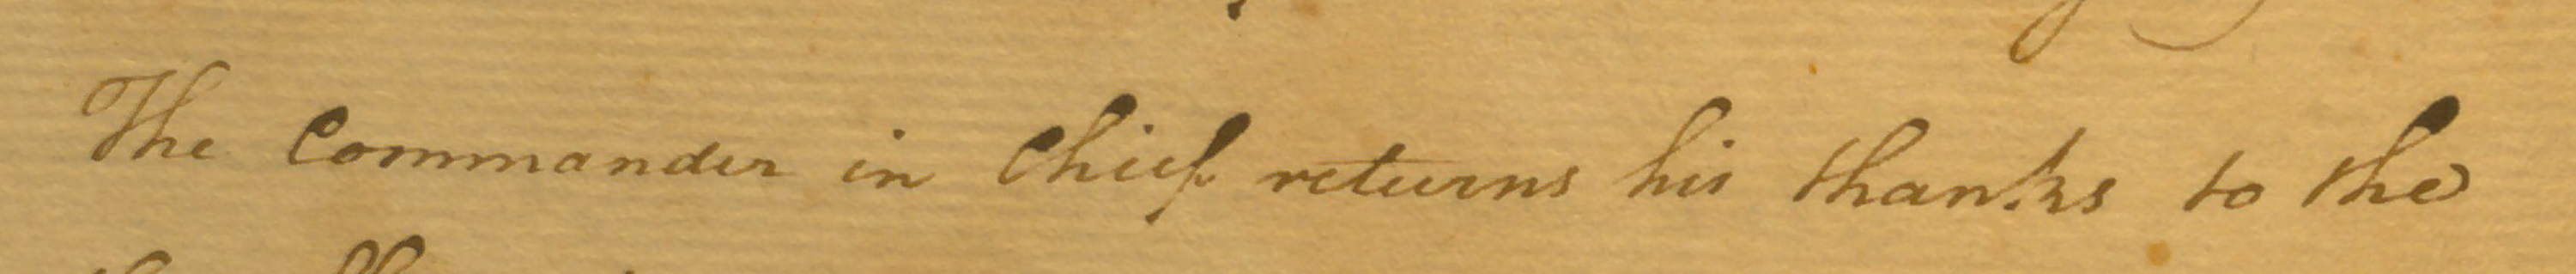The Commander in Chief returns his thanks to the
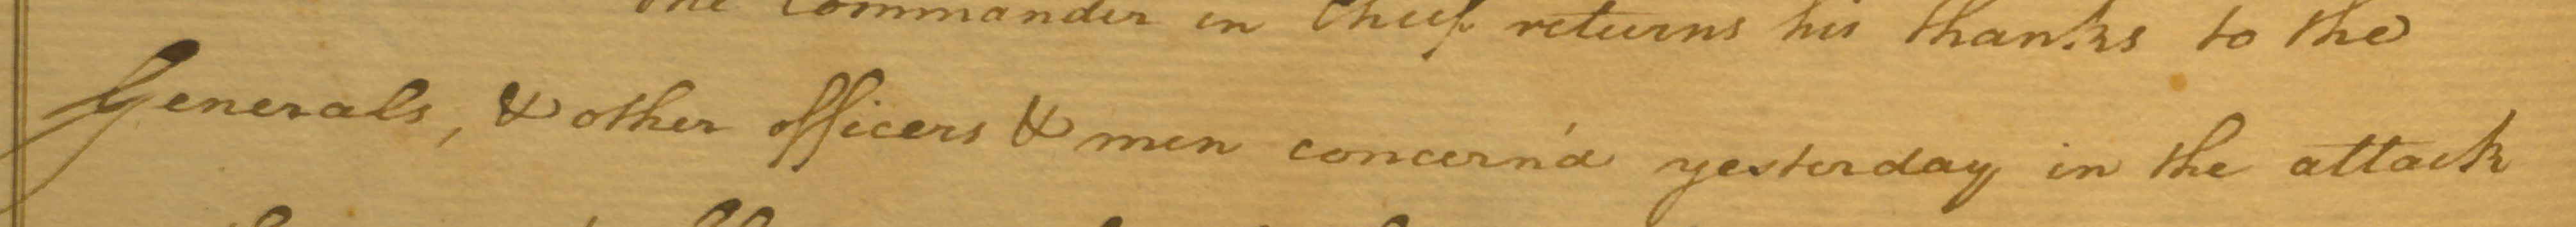Generals, & other officers & men concern'd yesterday in the attack
